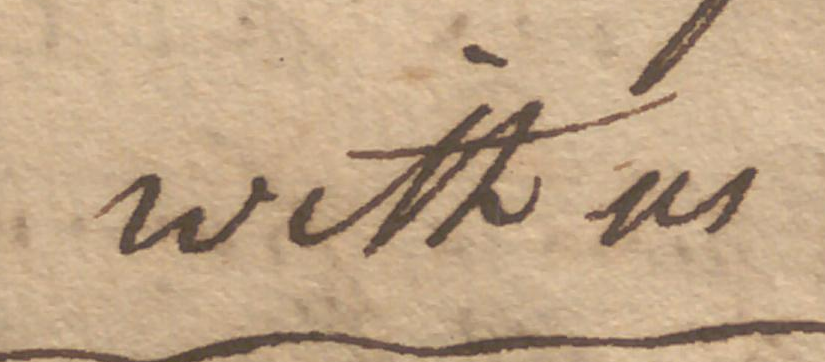with us
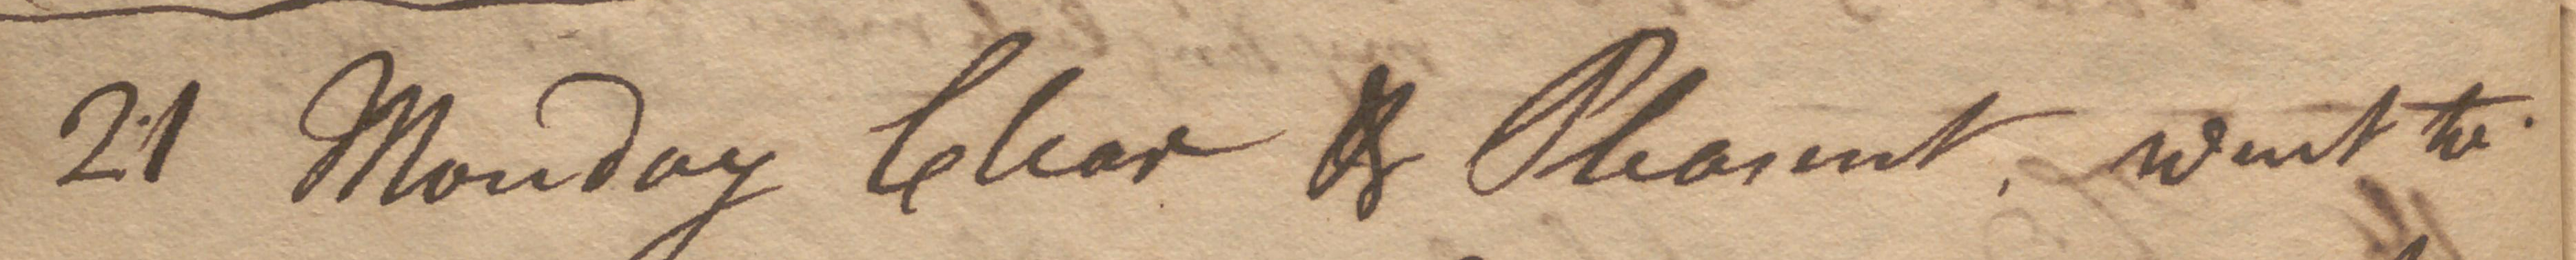21 Monday Clear & Pleasent, went to
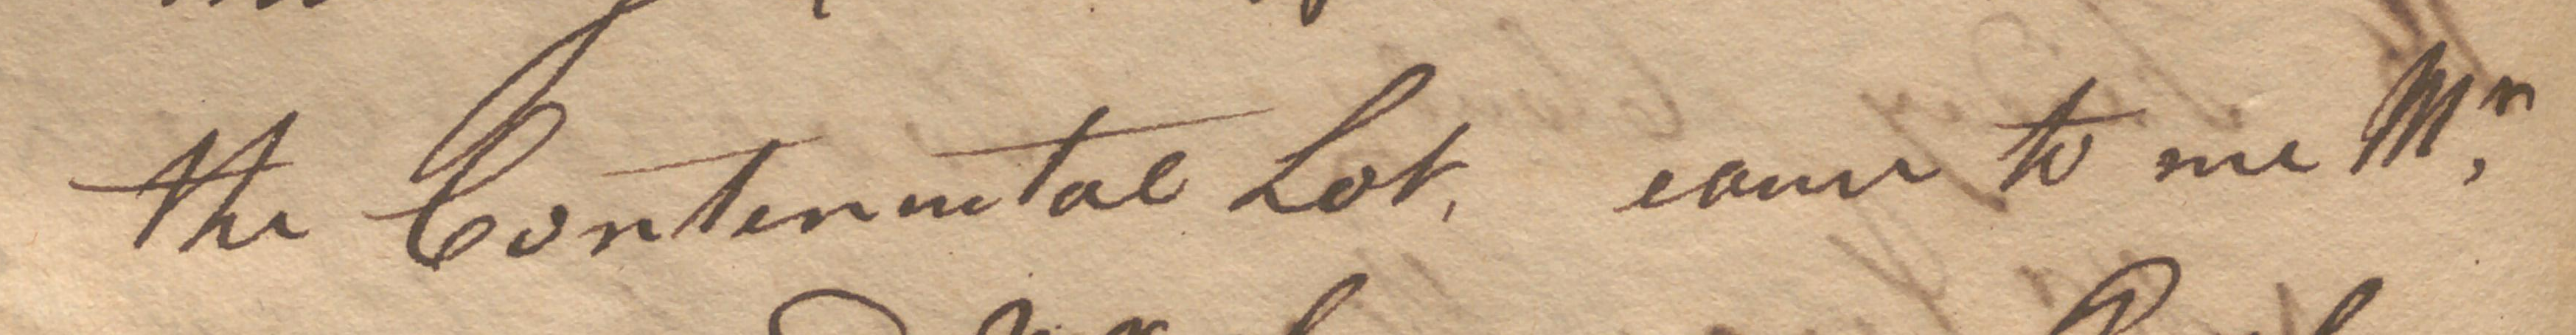the Continental Lot. came to me M^r.
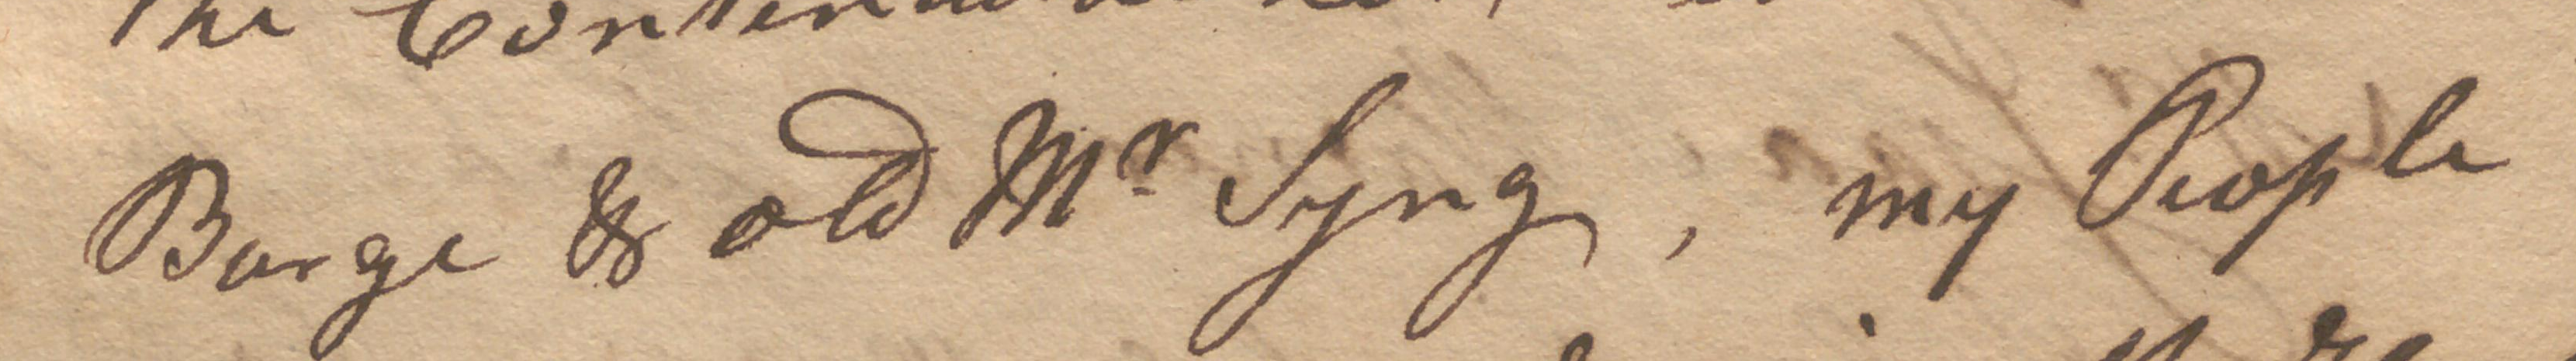Barge & old M^r Syng, my People
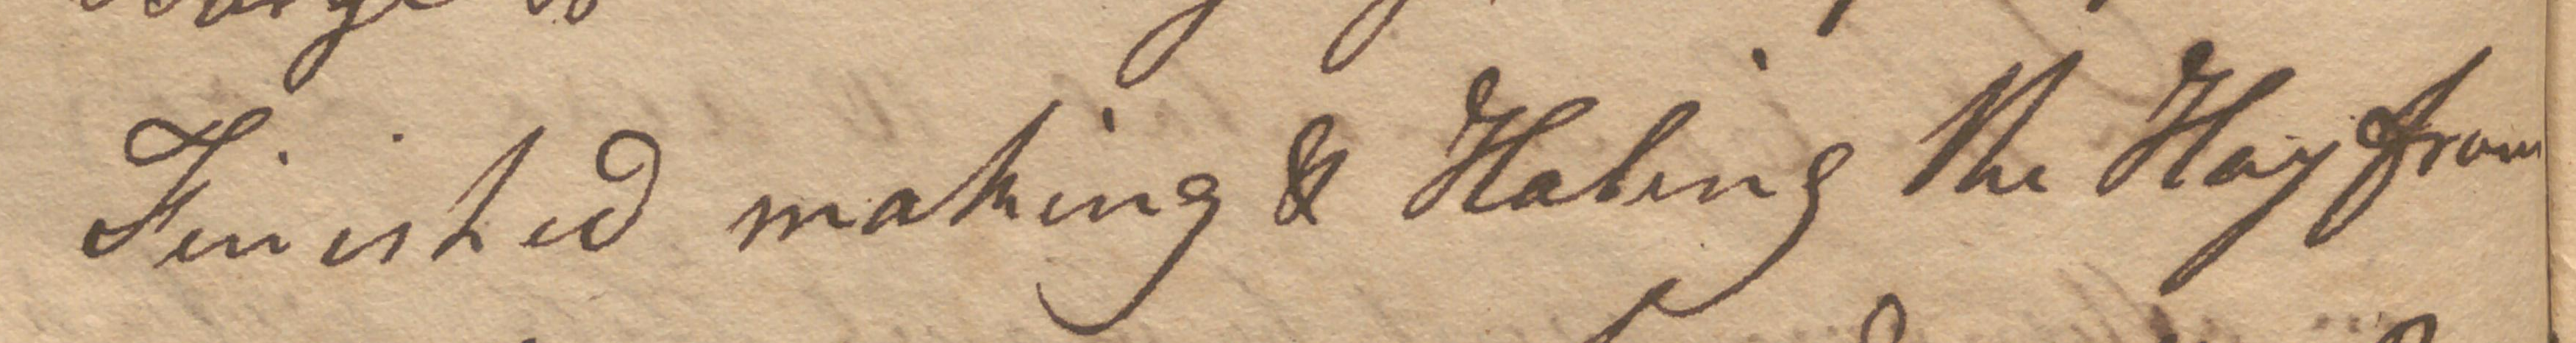Finished making & Haling the Hay from
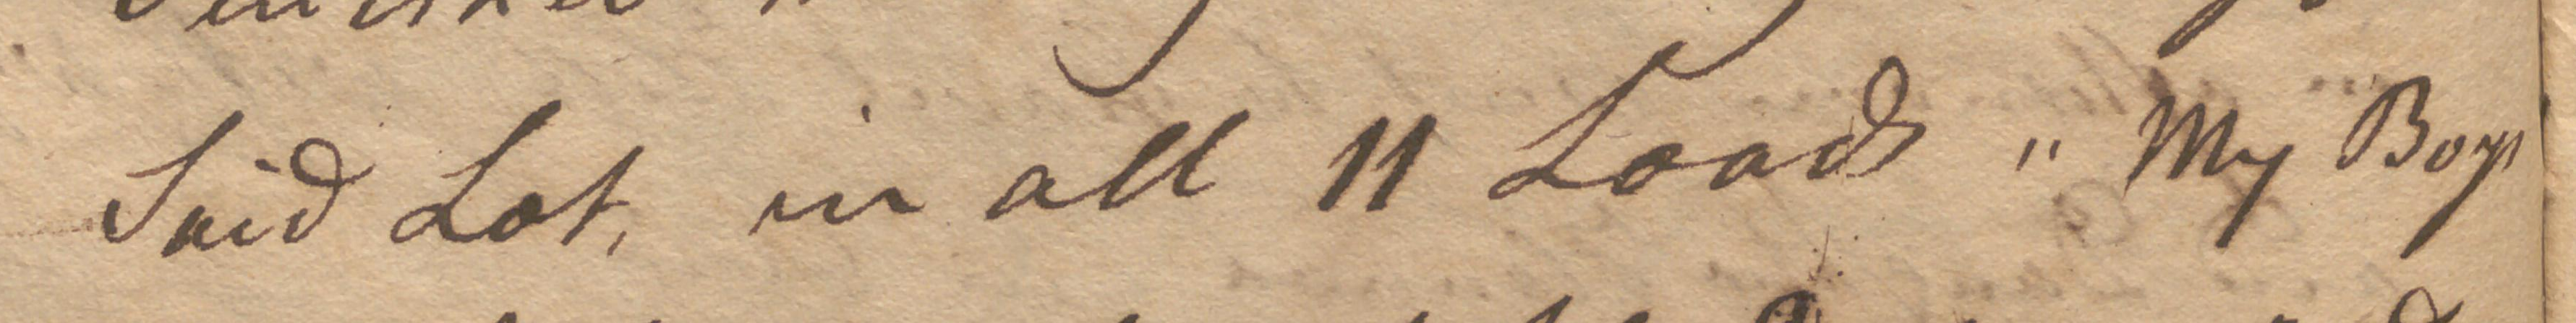Said Lot, in all 11 Loads. My Boy
